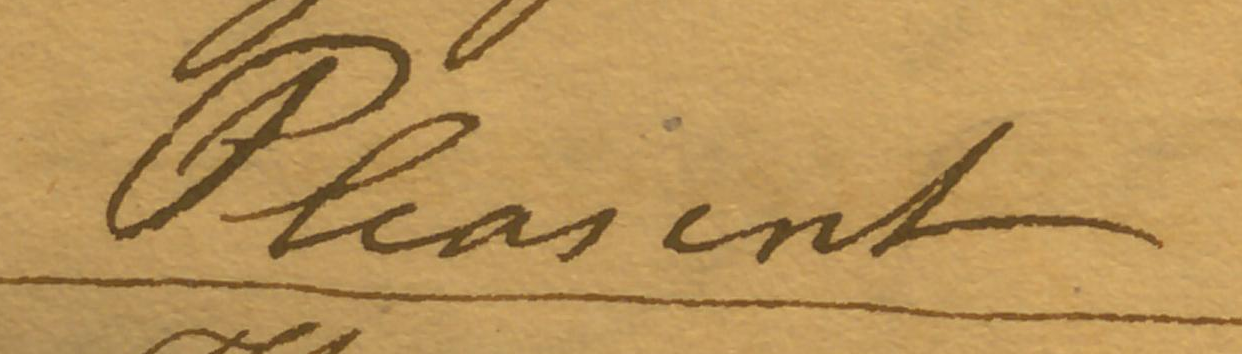Pleasent
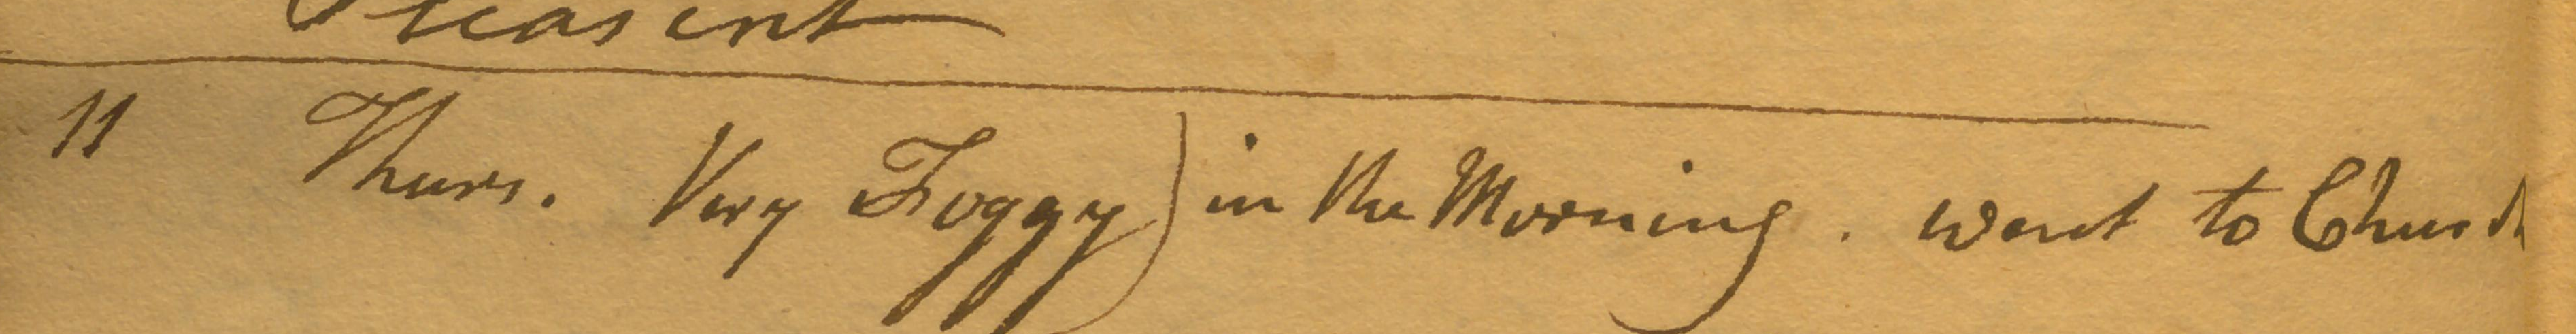11 Thurs. Very Foggy) in the Morning. went to Church
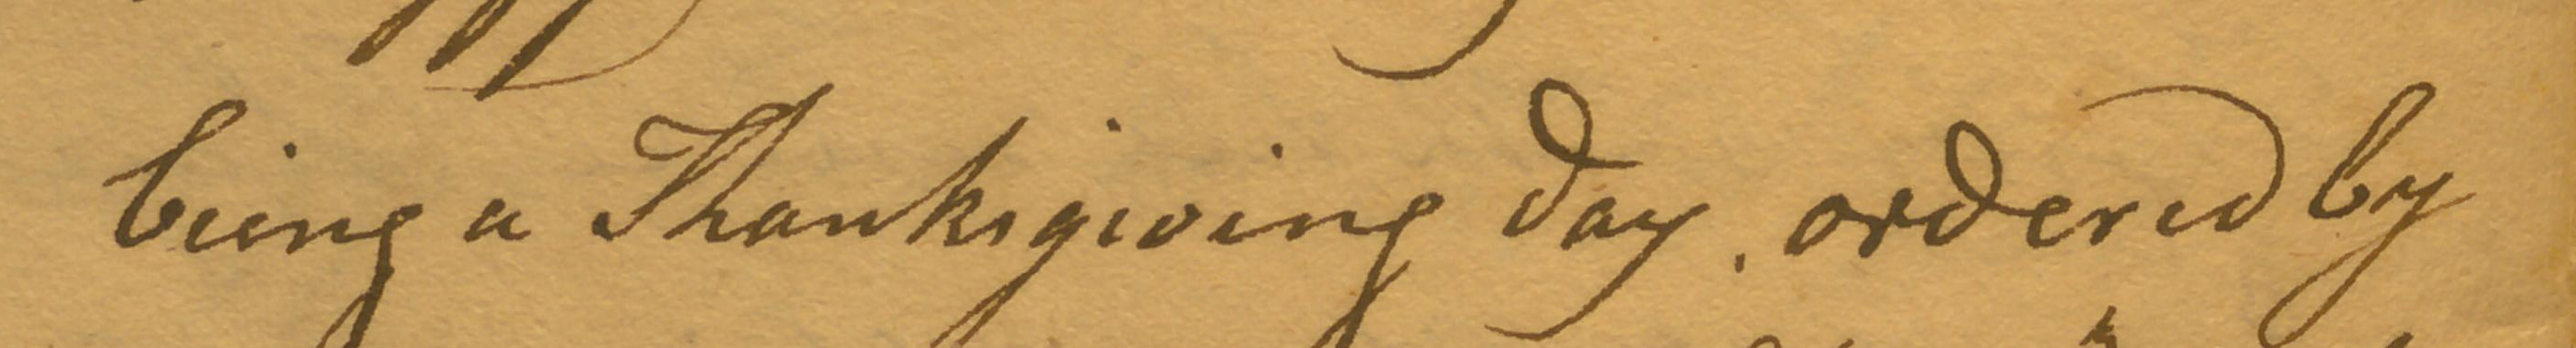being a Thanksgwing day ordered by
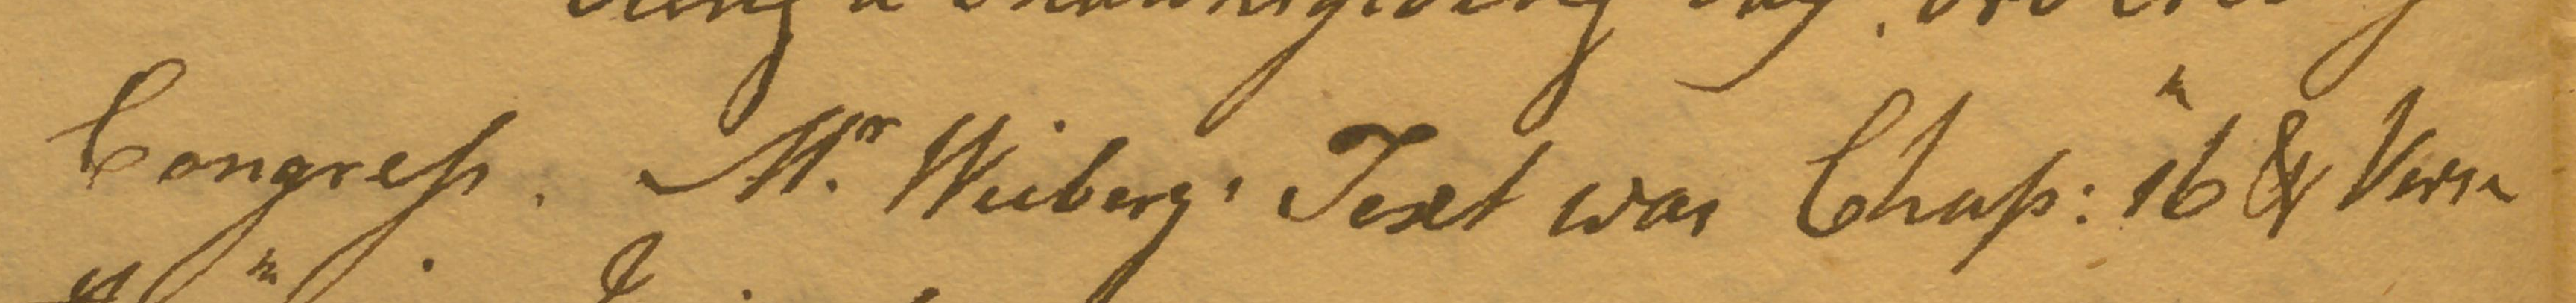Congress. M^r. Weibergs Text was Chap: 16^h & Verse
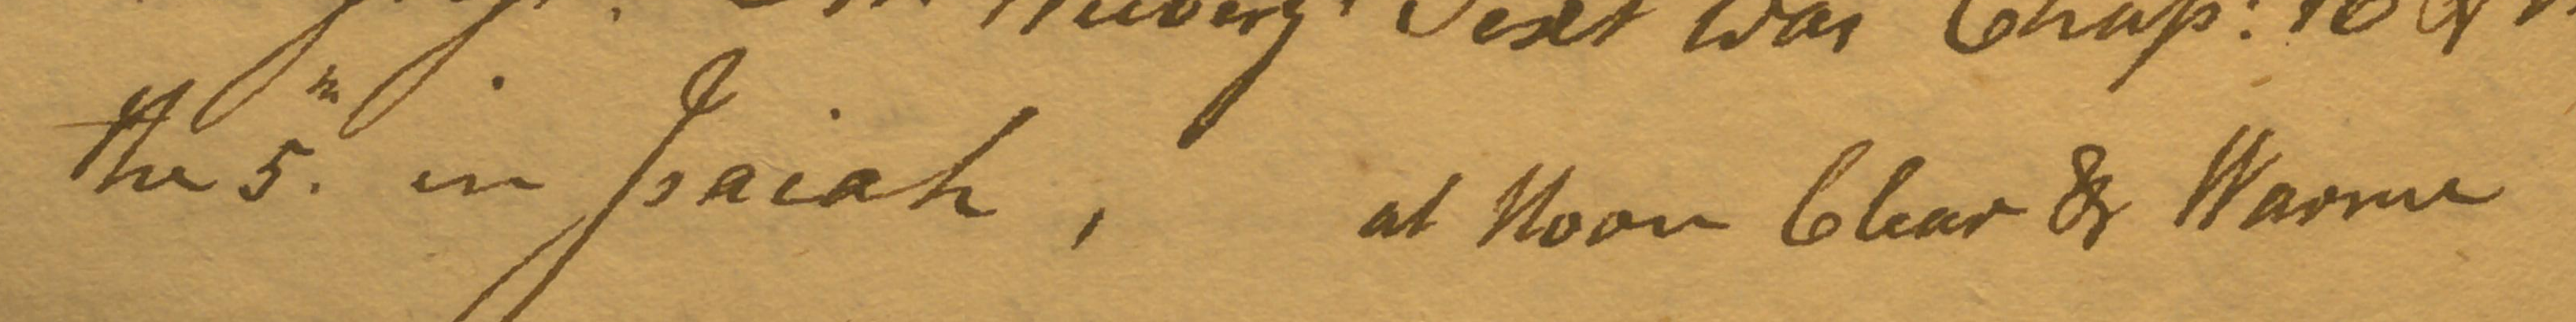the 5^th. in Isaiah, at Noon Clear & Warme
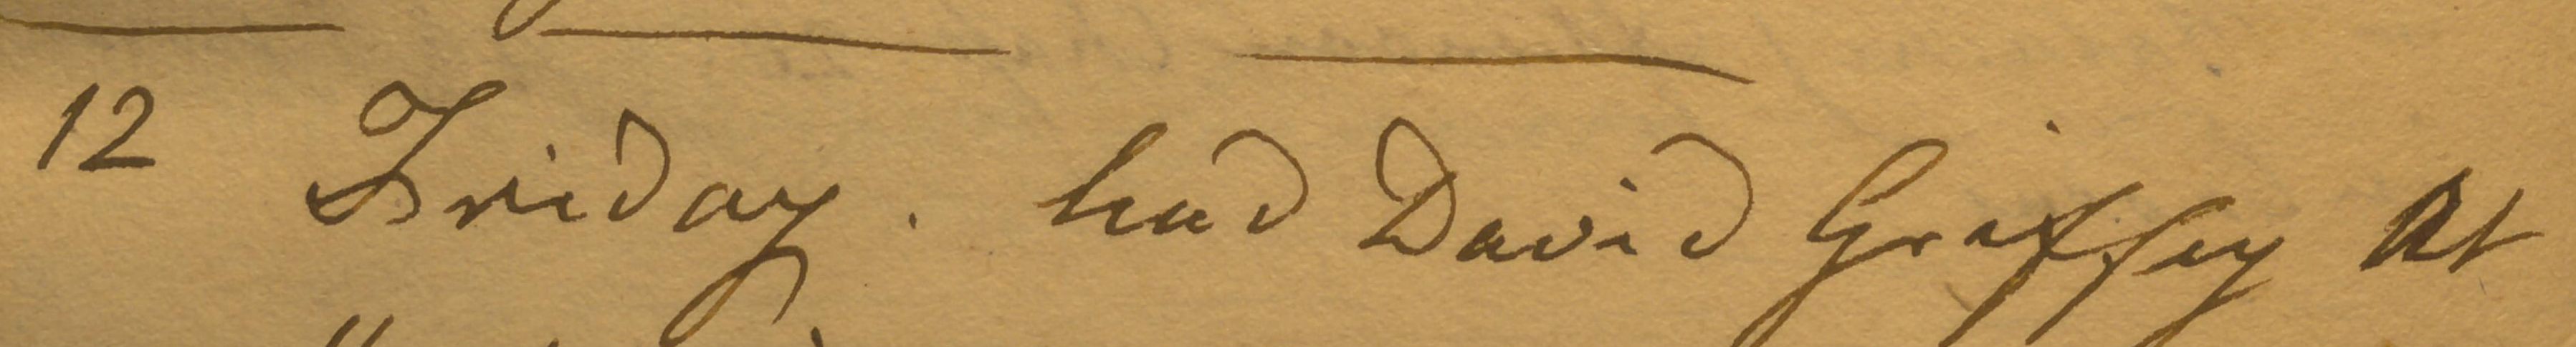12 Friday. had David Griffey at
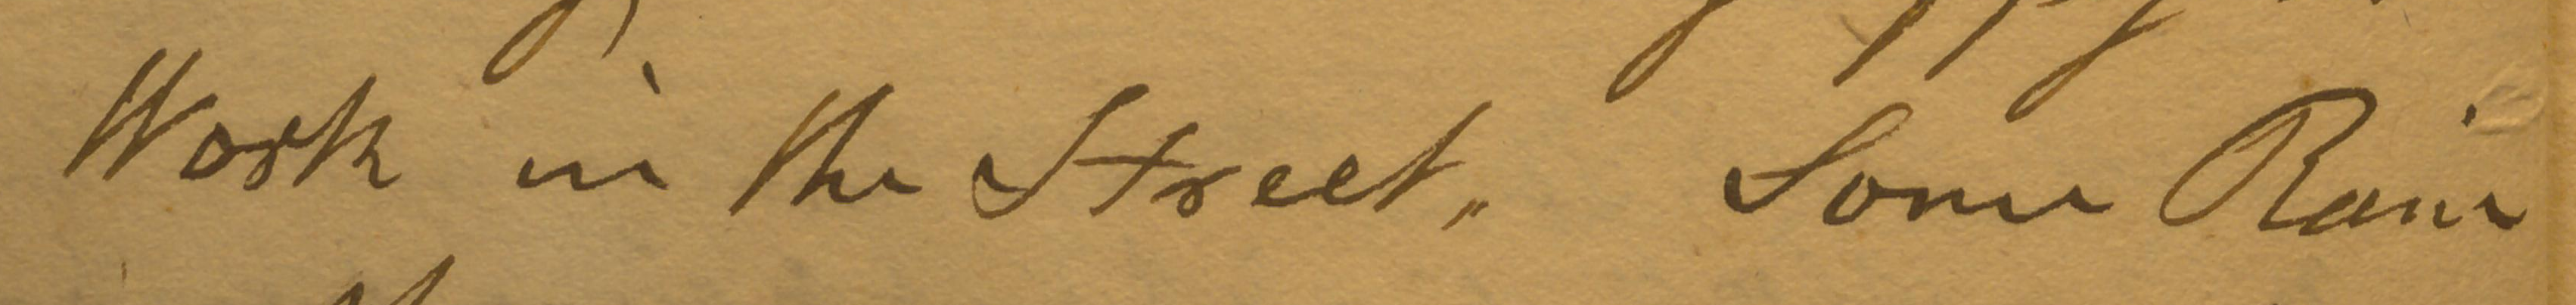Work in the Street, some Rain
